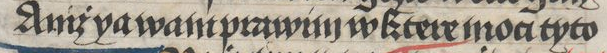Aniż ya wane prawím vkteré moci tyto
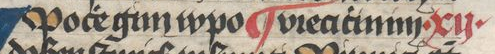Poċe gim wpo vieci ċinim.xij.
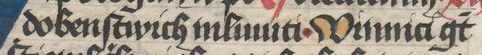dobenſtwích mluuiti.Vinnici ḡt
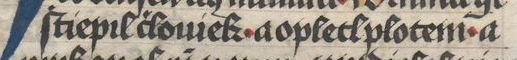ẛtiepil ċlouiek.a opletl plotení.a
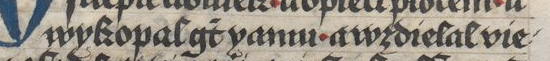O pykopal ḡt yanuu.a wzdielal vie¬
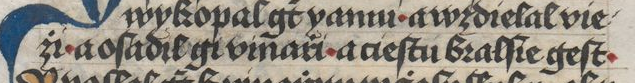żi.a oſadil gi vinaṙi.a cieſtu bral ſie geſt.
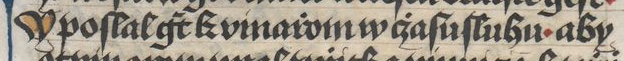Y poſlal ḡt kvinaṙom w cżaſu ſluhu.aby
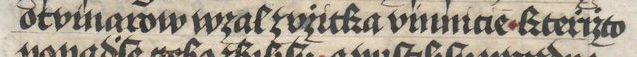otvinarow wzal zvżitka vinnicie.kteṙíżto
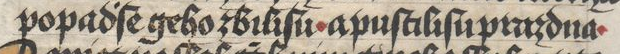popaḋẛe geho zbiliſu.a puſtiliſu prazdna.
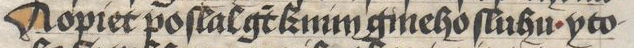A opiet poſlal ḡt knim gineho ſluhu.yto
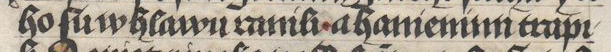ho ſu w hlawu ranili.a hanienim trapi¬
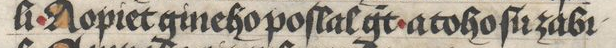li.A opiet gineho poſlal ḡt.a toho ſu zabi¬
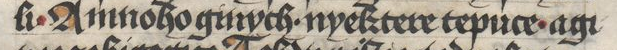li.A mnoho ginych.nyekteré tepuce.a gi¬
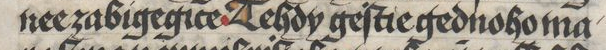nee zabígegíce.Tehdy geẛtie gednoho ma¬
